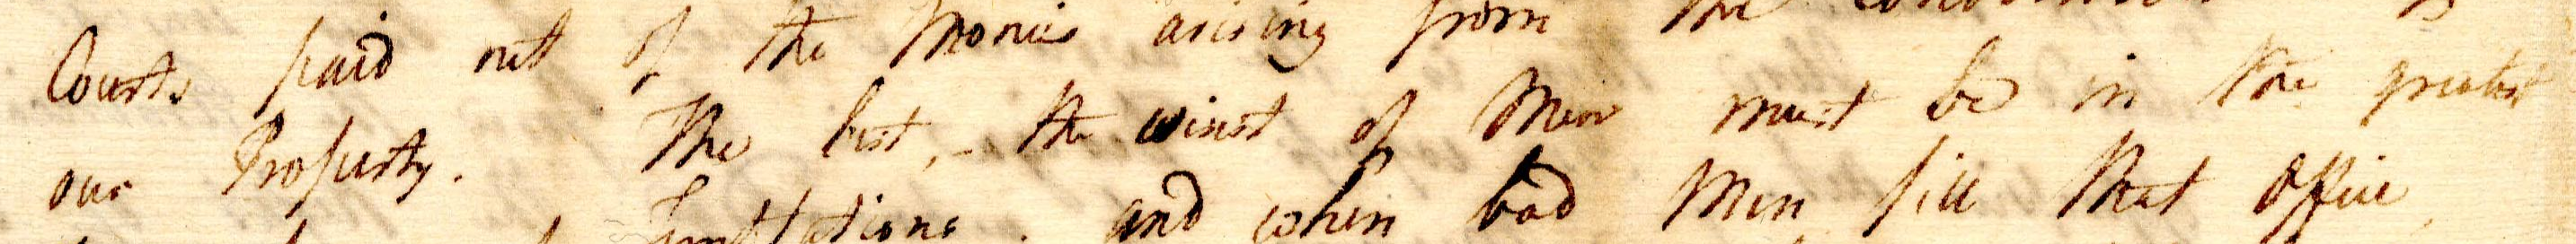our Property. The best, the Wisest of Men must be in the greatest
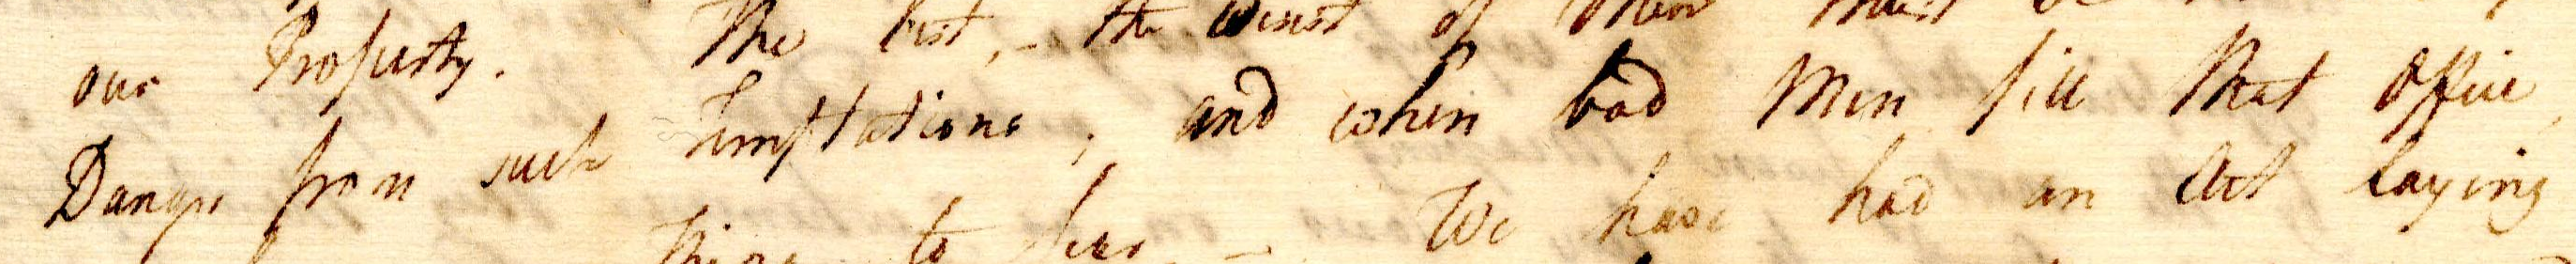Danger from such Temptations, and when bad Men fill that Office
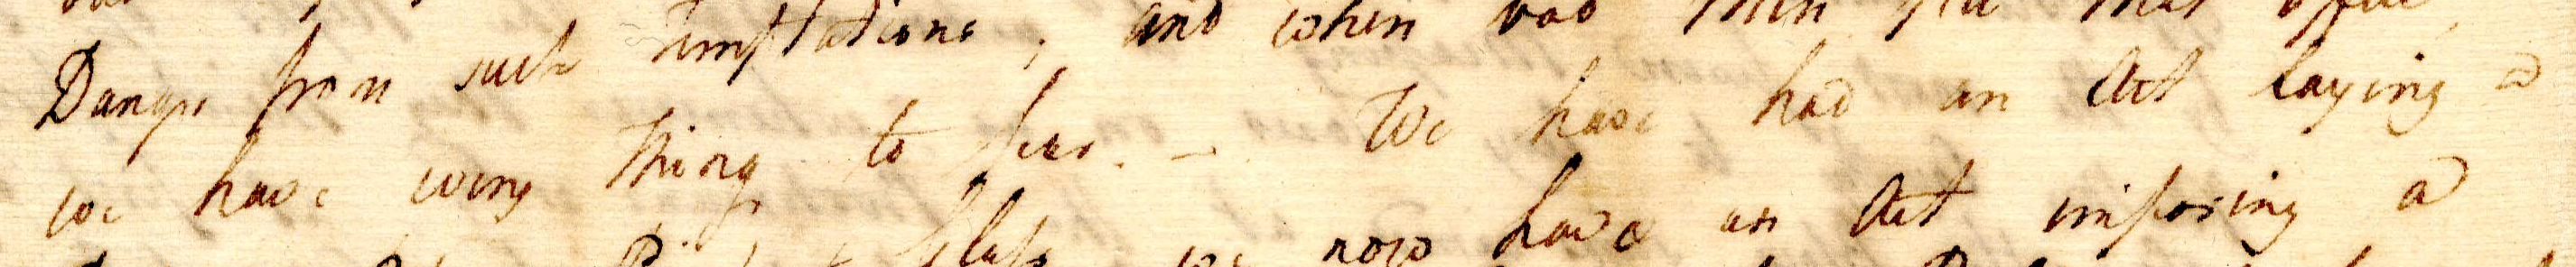we have every Thing to fear. We have had an Act laying a
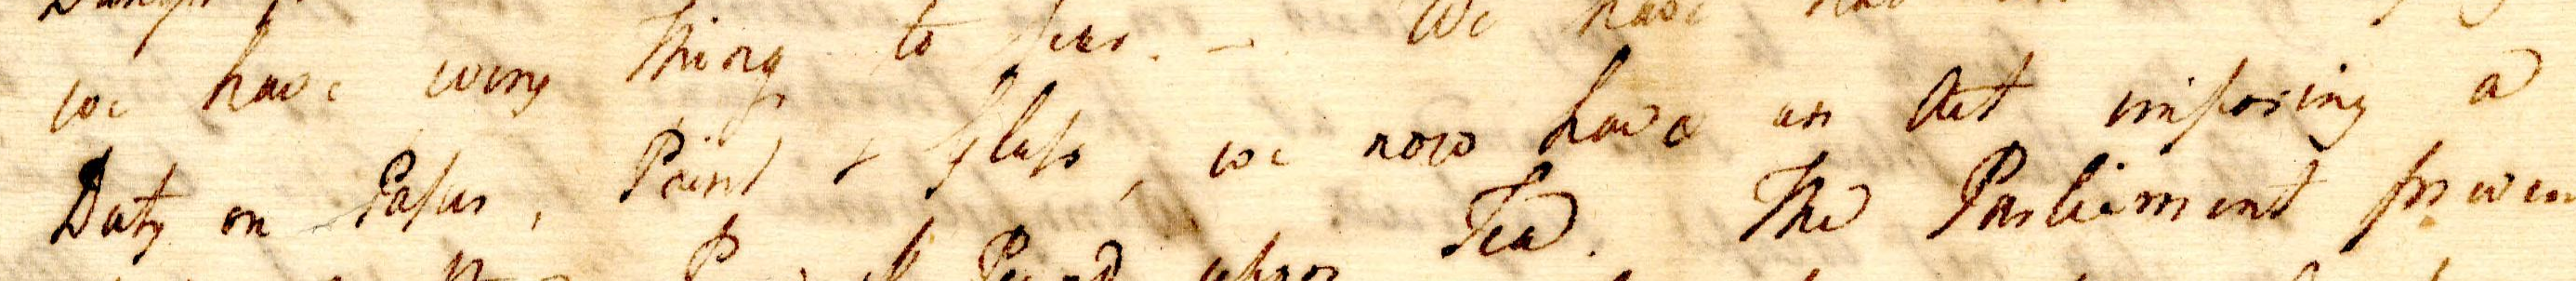Duty on Paper, Paint & Glass, we now have an Act imposing a
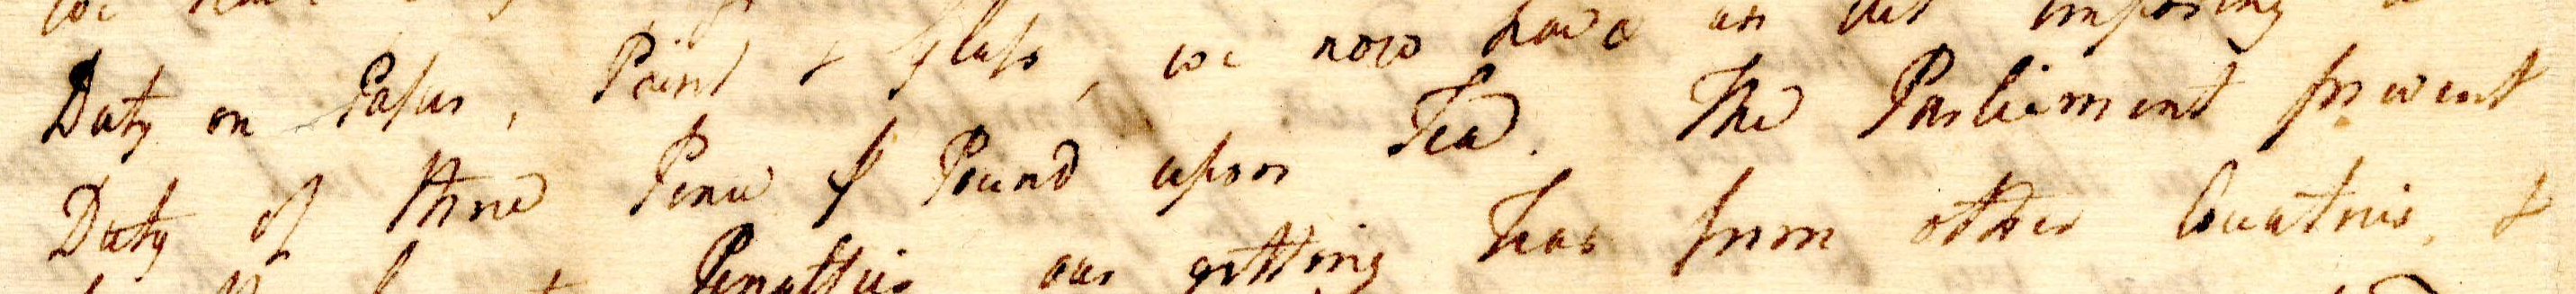Duty of three Pence per Pound upon Tea. The Parliament prevent
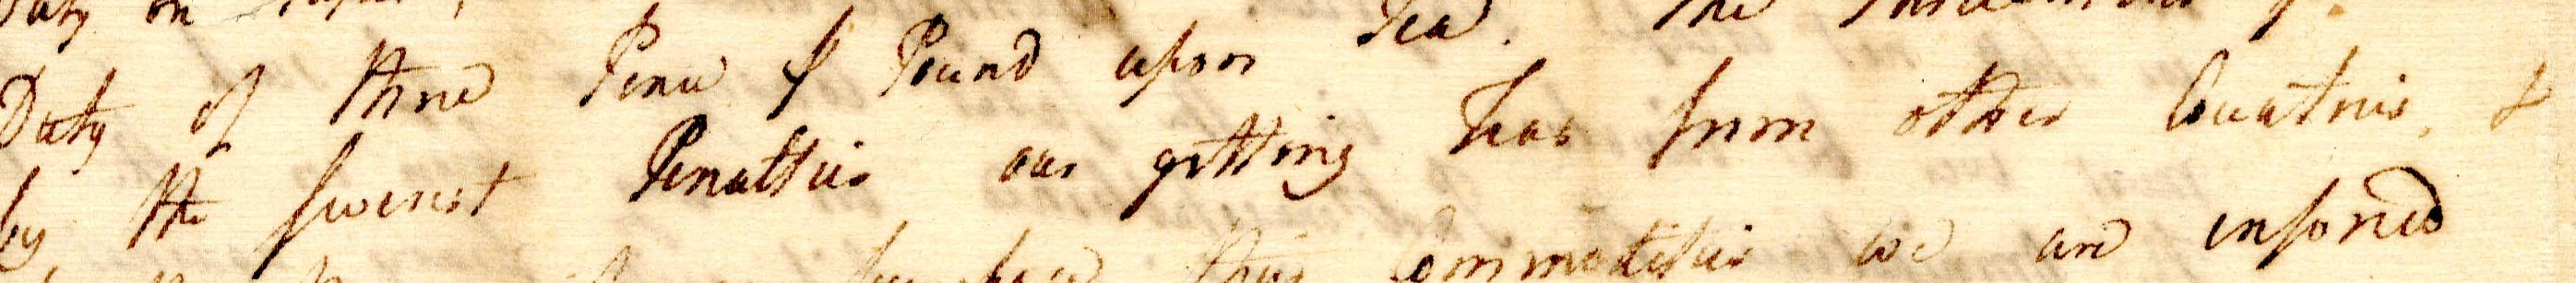by the severest Penalties our getting Teas from other Countries &
